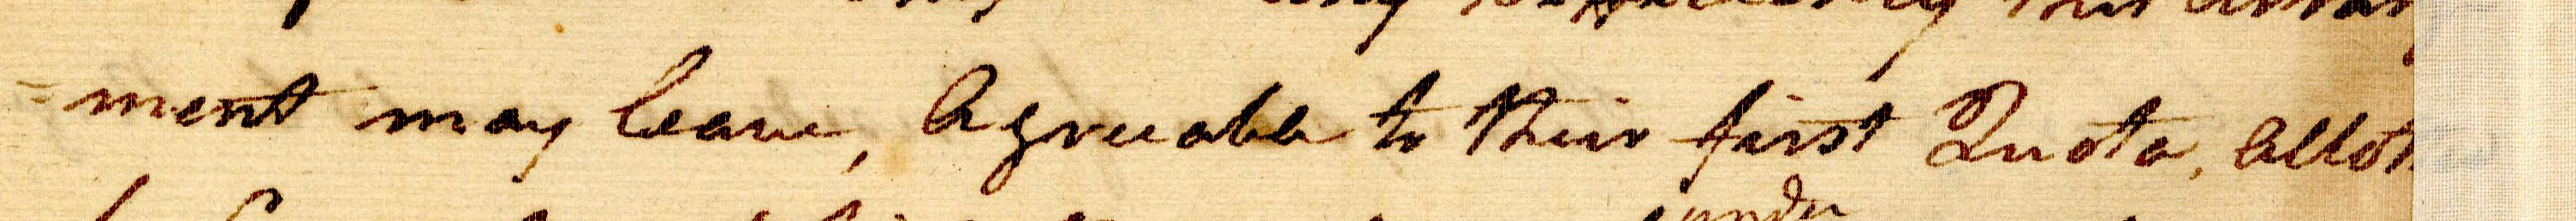-ment may leave, Agreeable to their first Quota, allotted
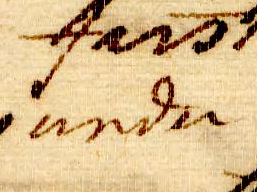under
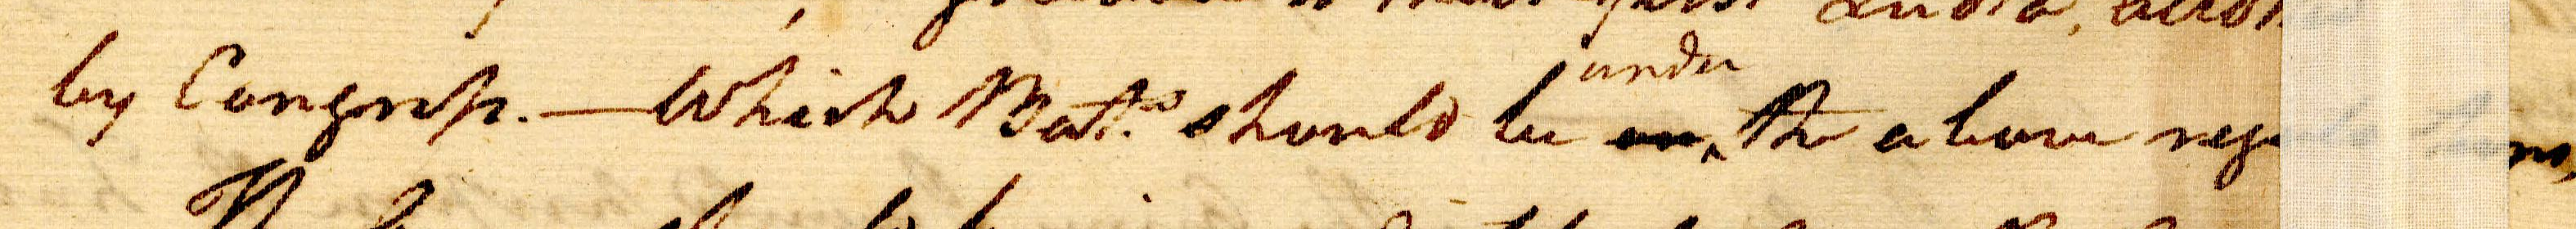by Congress.- Which Bat^ts. should be ^ the above negotiations
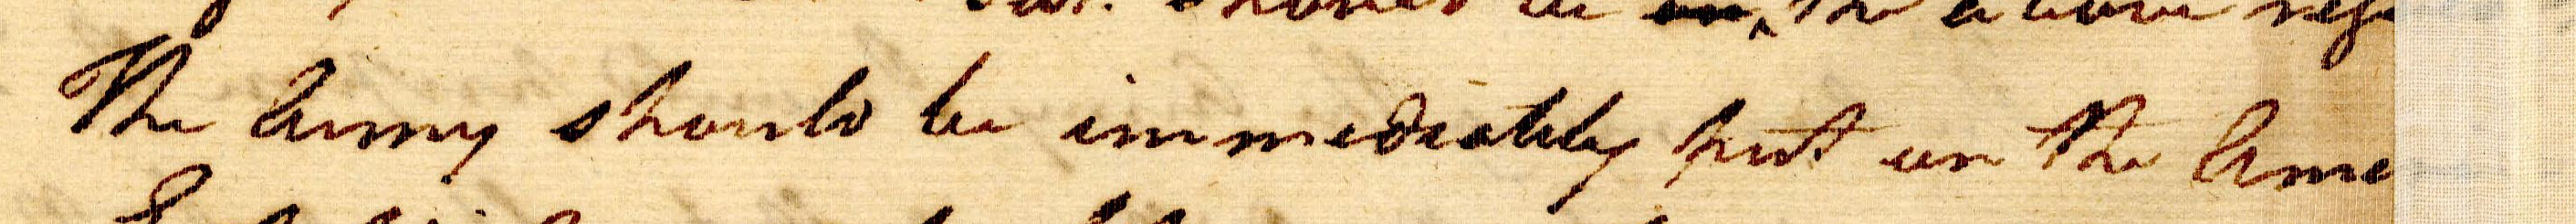The Army should be immediately put on the Ameri
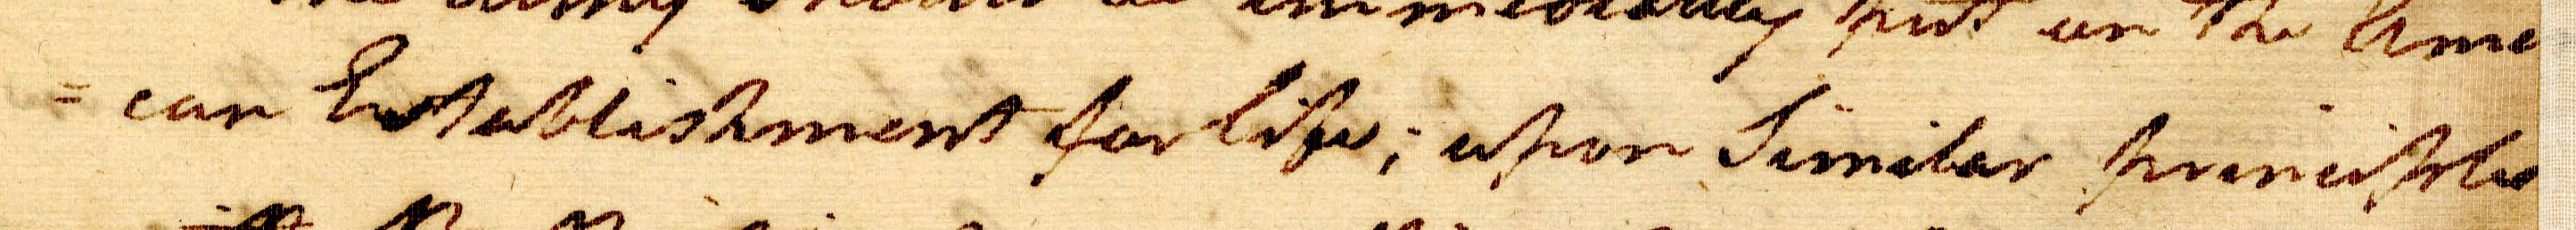-can Establishment for life; upon Similar principles
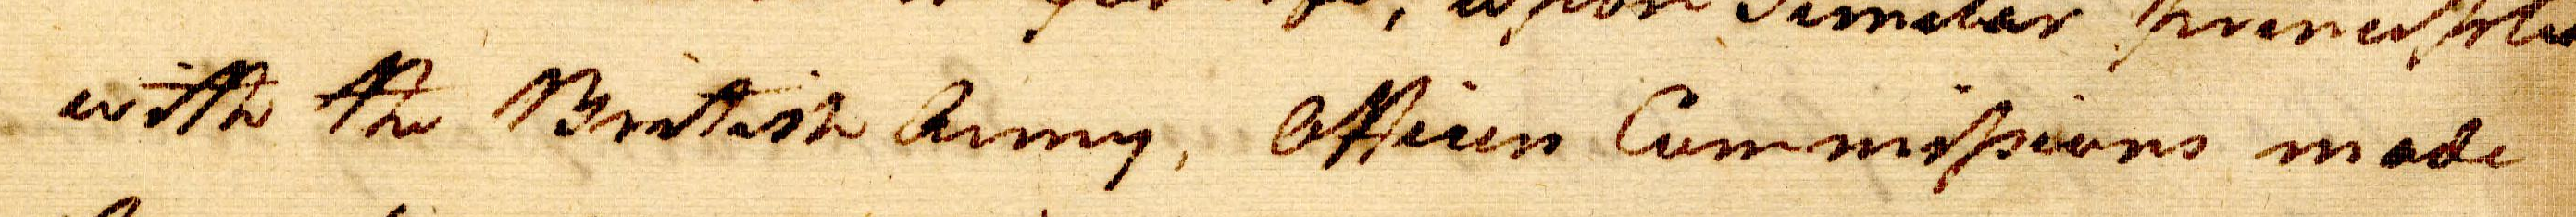with the British Army, Officer Commissions made
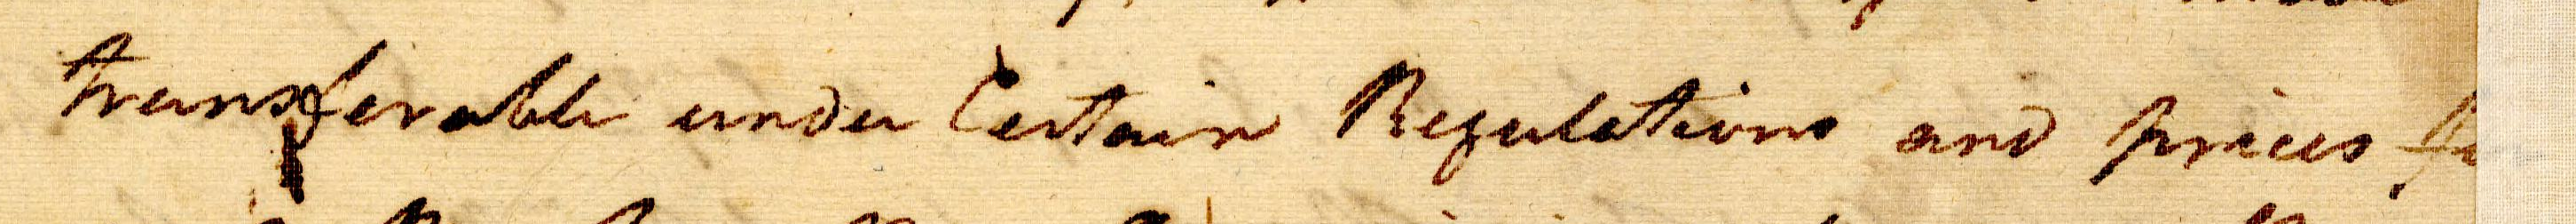transferable under Certain Regulations and prices for
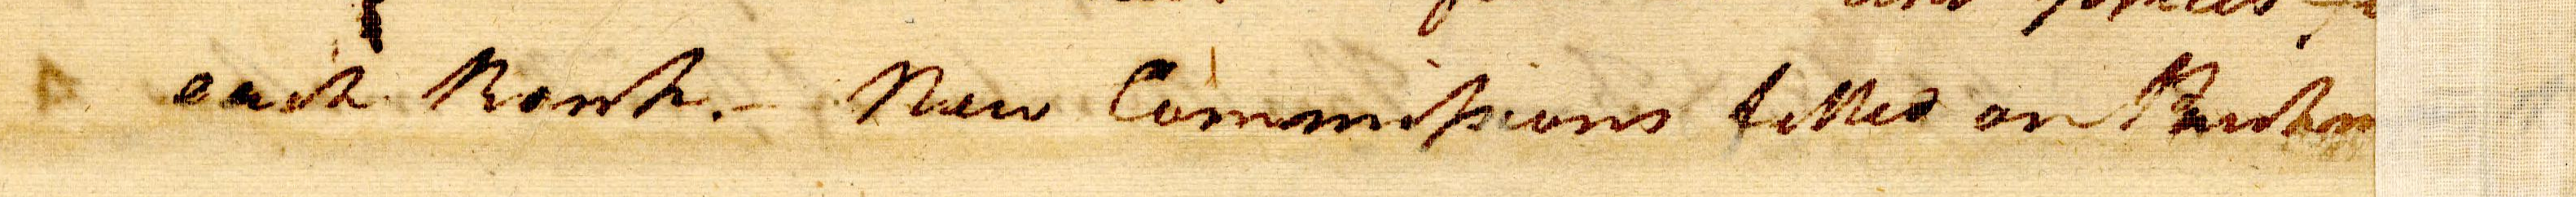each Rank. New Commissions filled on Parchment
